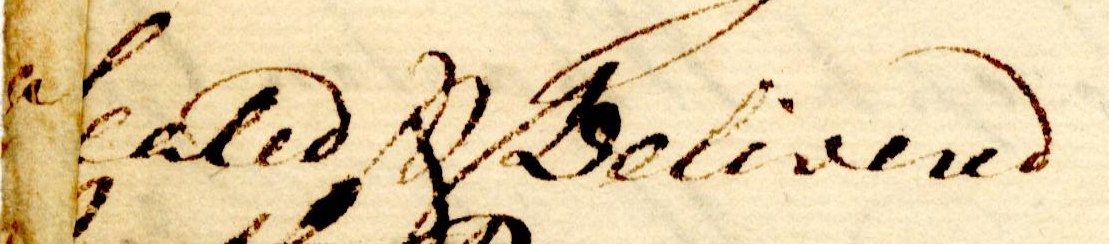Sealed & Delieverd
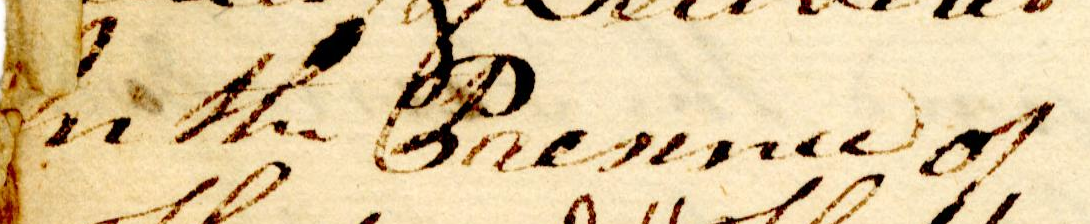in the Presence of
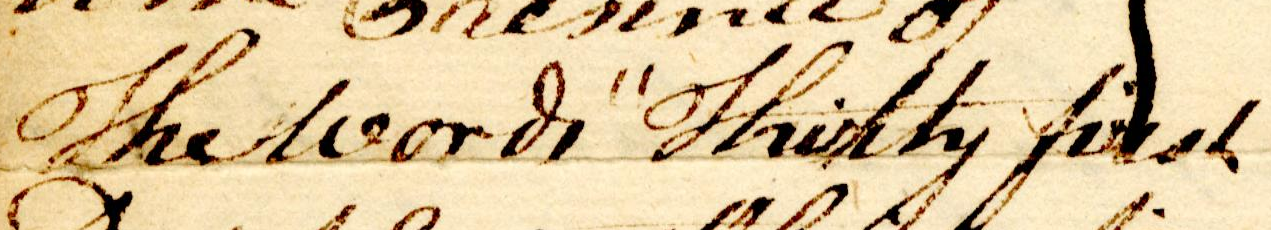The Words "Thirty first
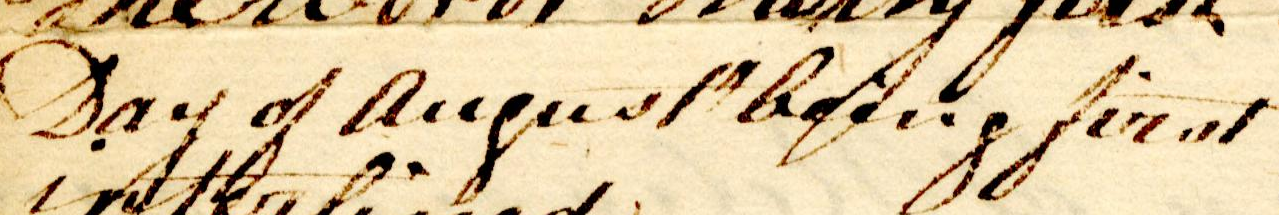Day of August" Adding first
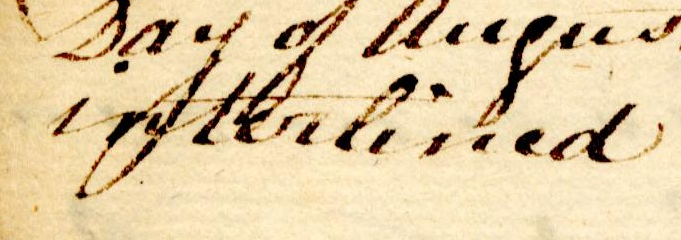interlined
